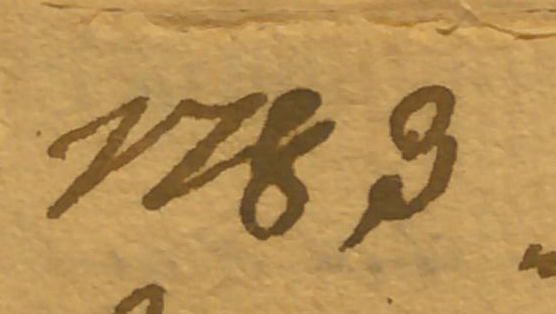1783
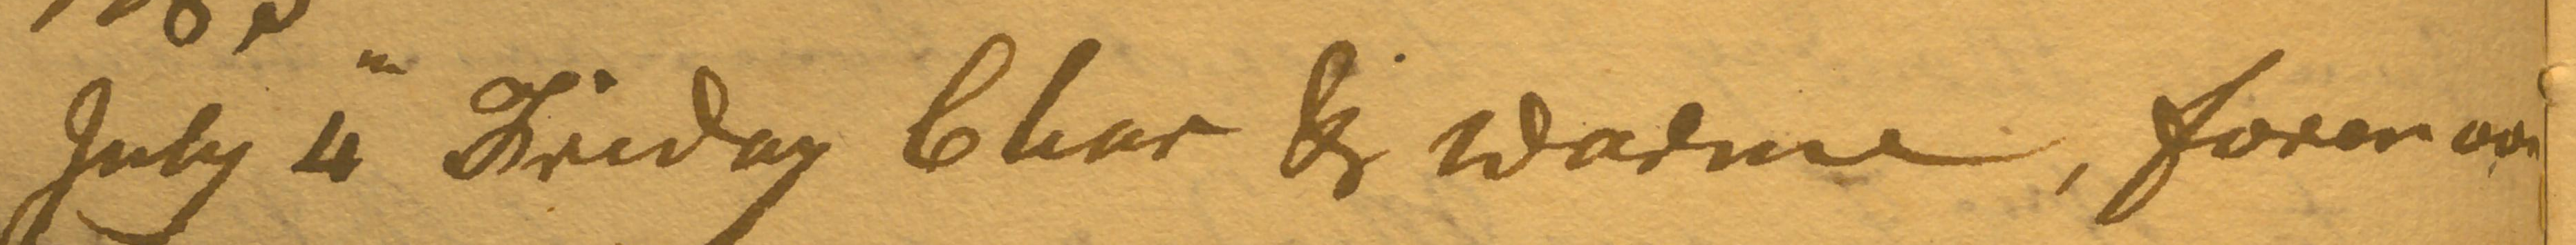July 4^th Friday Clear & warm forenoon
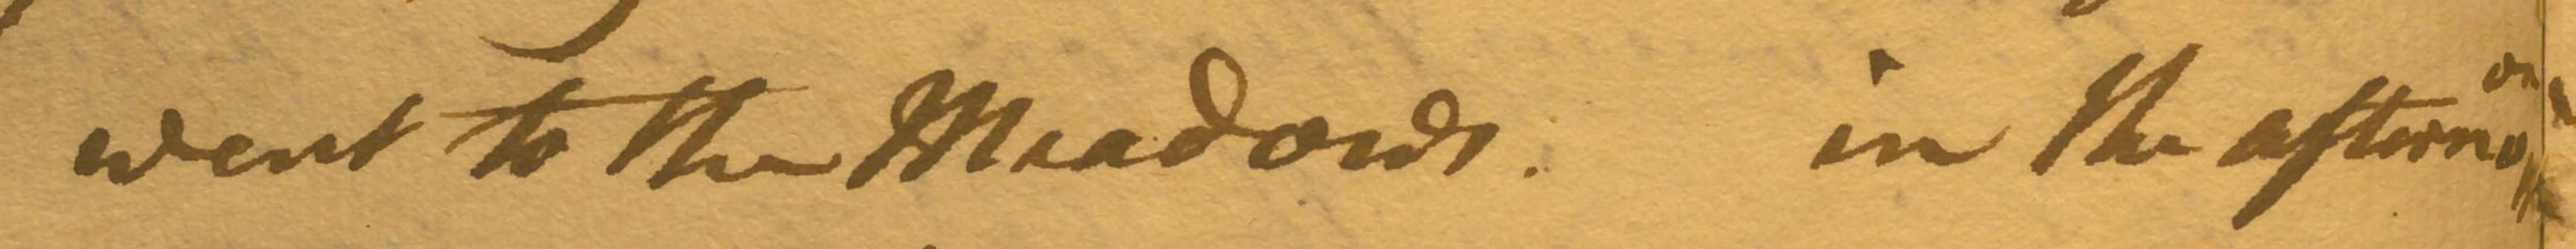went to the Meadows. in the afterno^on
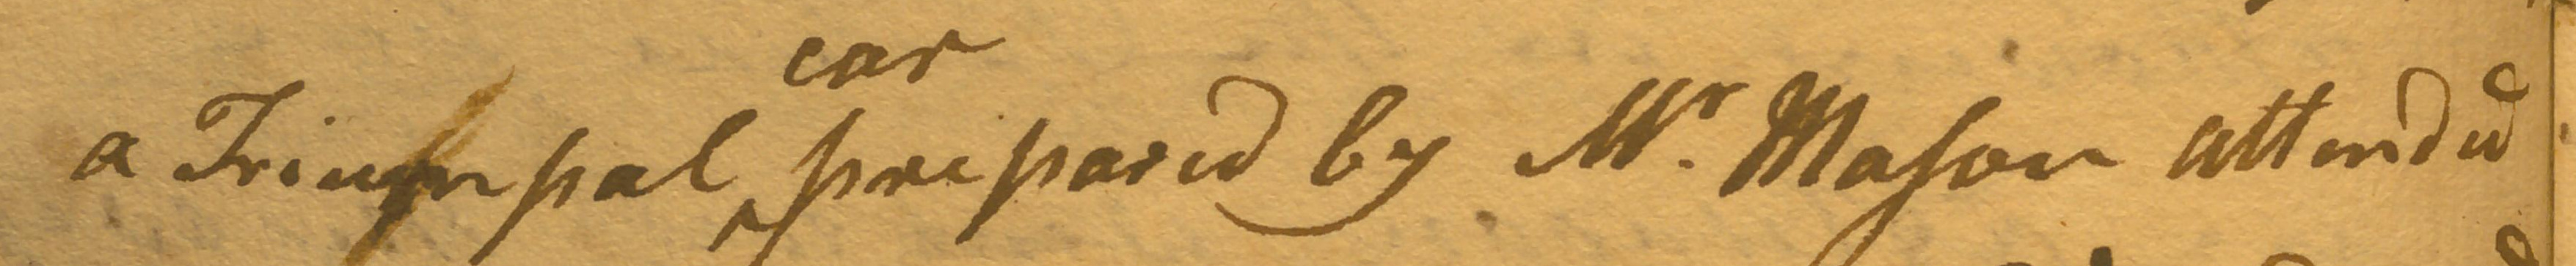a Triumpal ^ prepared by M^r. Mason attended
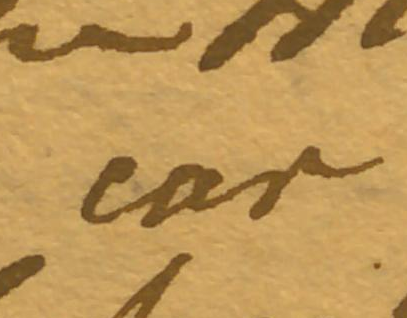car
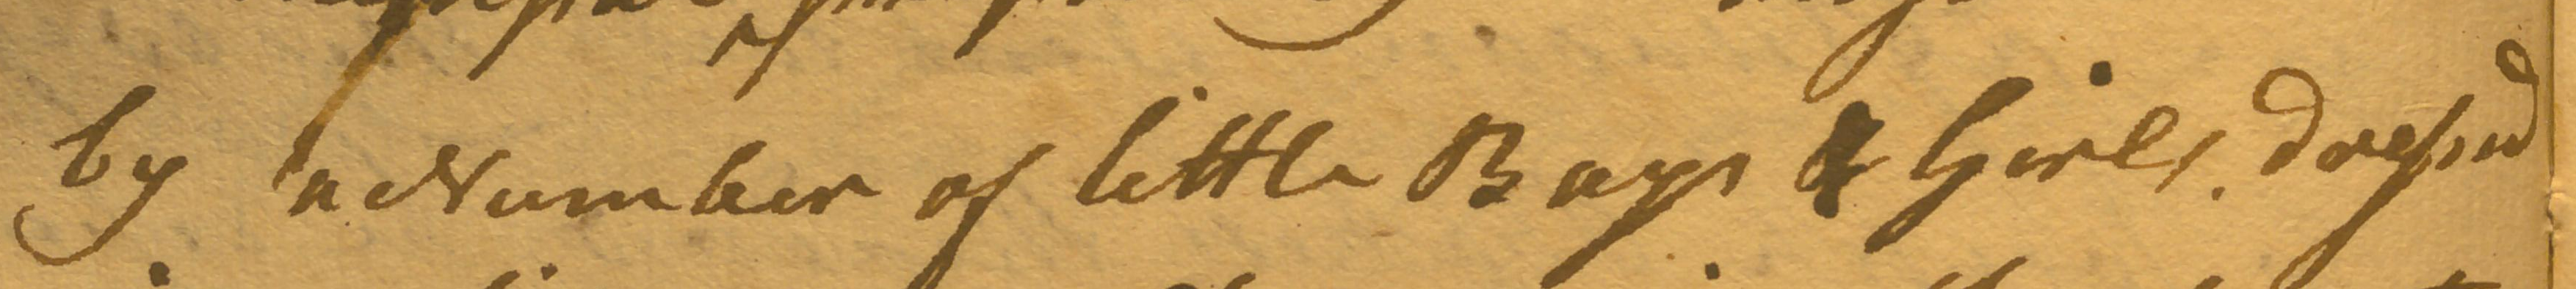by a Number of little Boys & Girls dressed
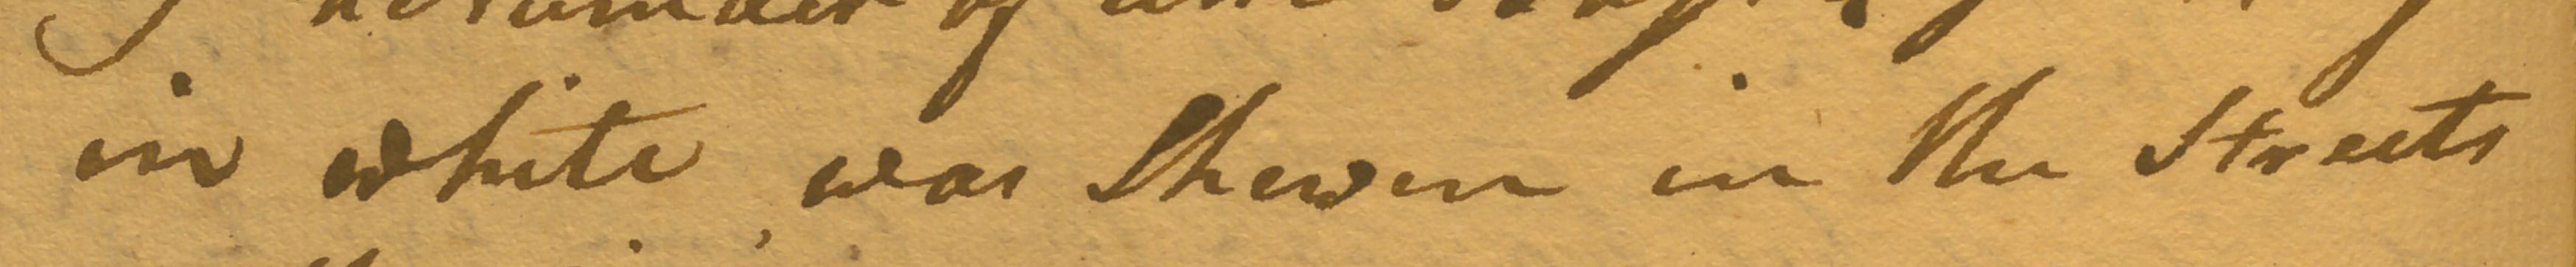in white was Shewen in the Streets
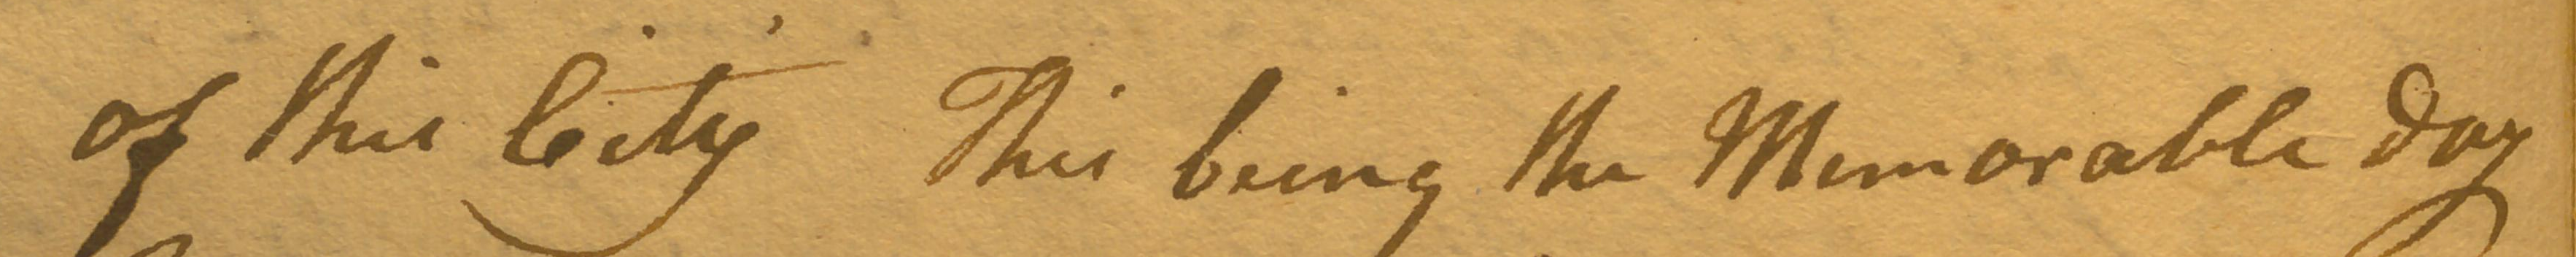of this City This being the Memorable day
